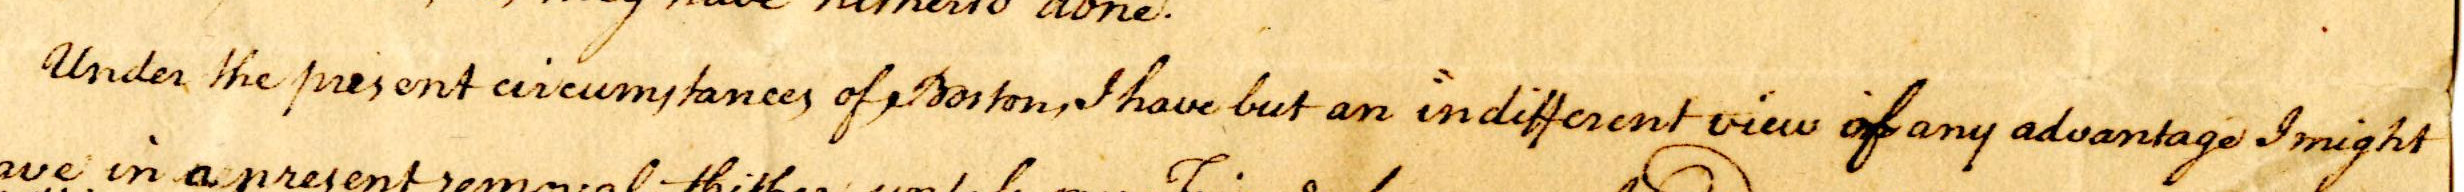Under the present circumstances of Boston, I have but an indifferent view of any advantage I might
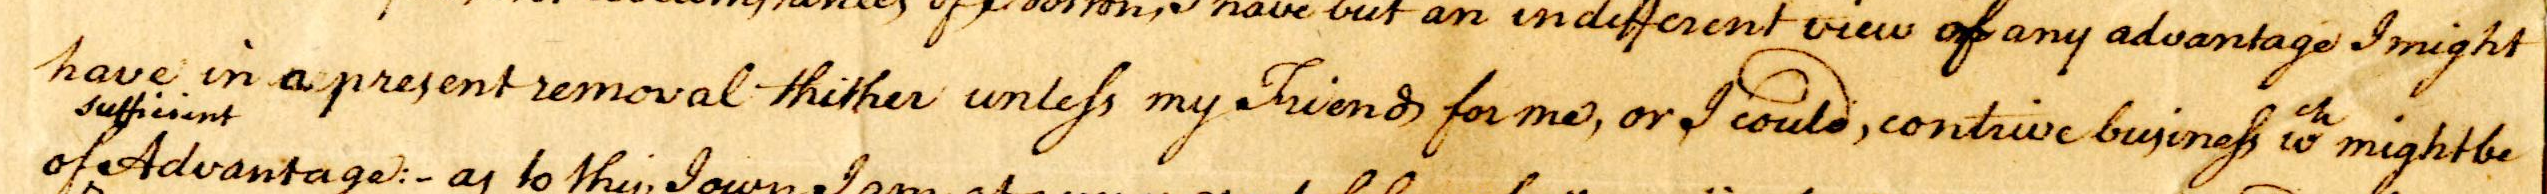have in a present removal thither unless my Friends for me, or I could, contrive business w^ch might be
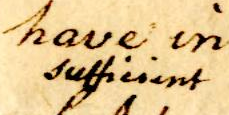sufficient
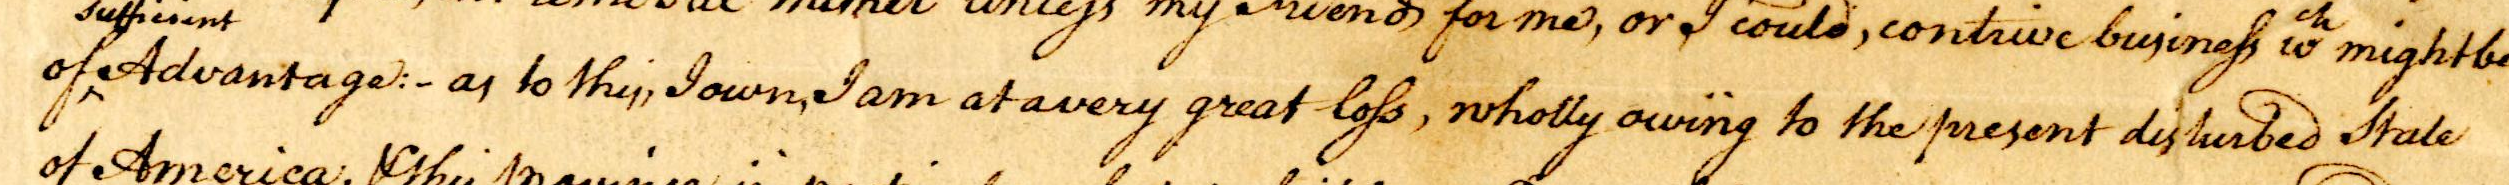of ^ Advantage:- as to this I own, I am at a very great loss, wholly owing to the present disturbed State
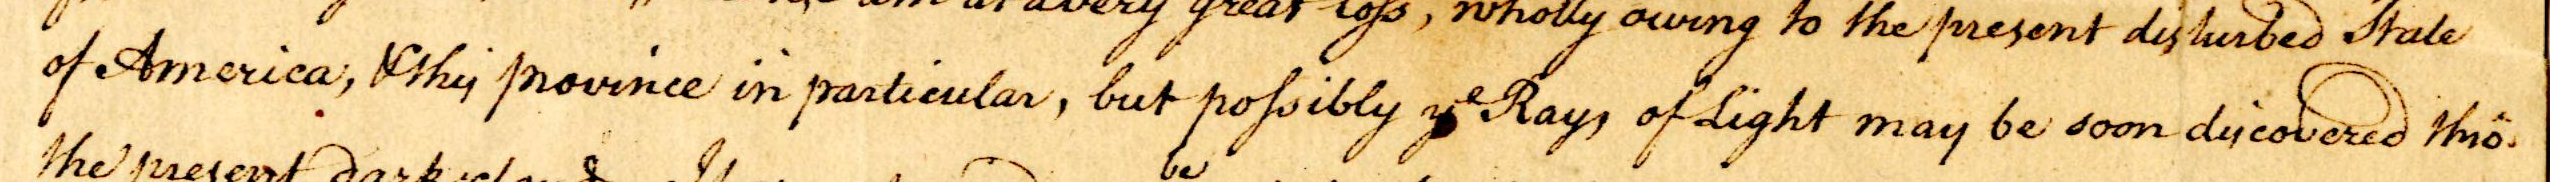of America, & this province in particular, but possibly y^e Rays of Light may be soon discovered thro.
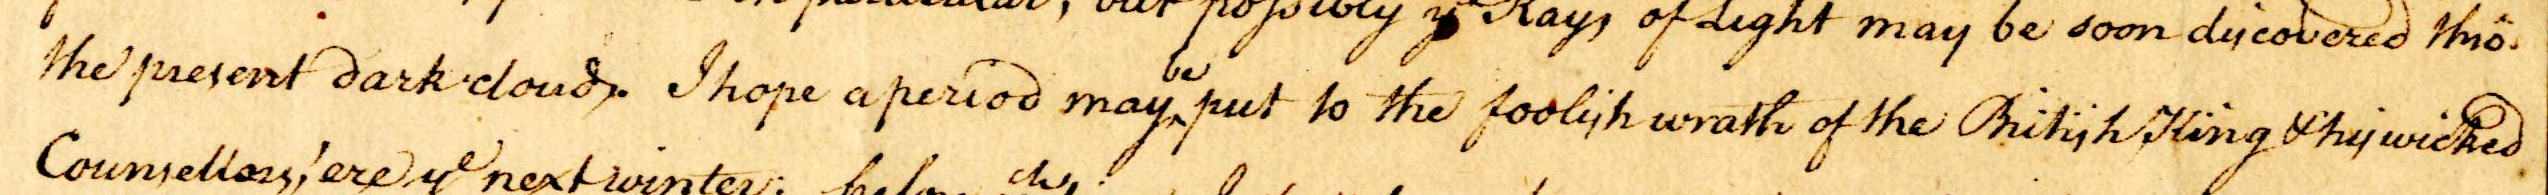the present dark clouds. I hope a period may ^ put to the foolish wrath of the British King & his wicked
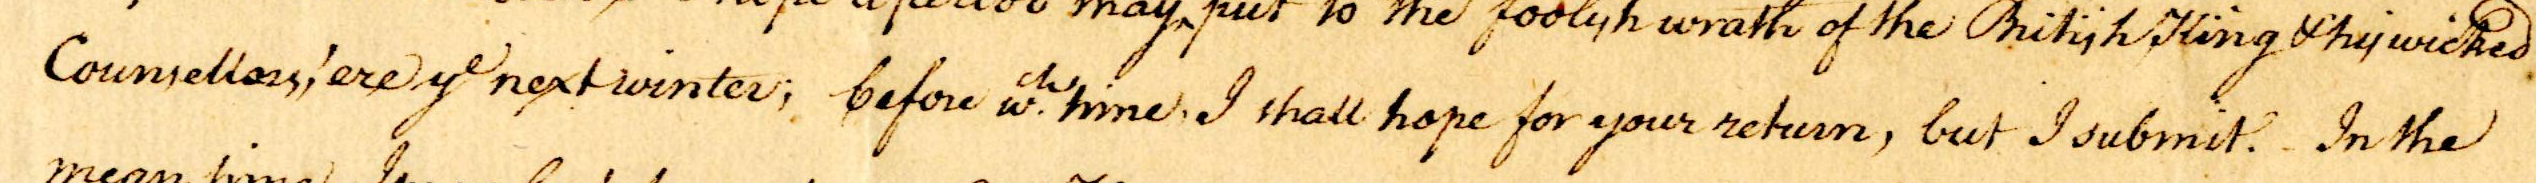Counsellors, 'ere y^e next winter; before w^ch. time I shall hope for your return, but I submit. In the
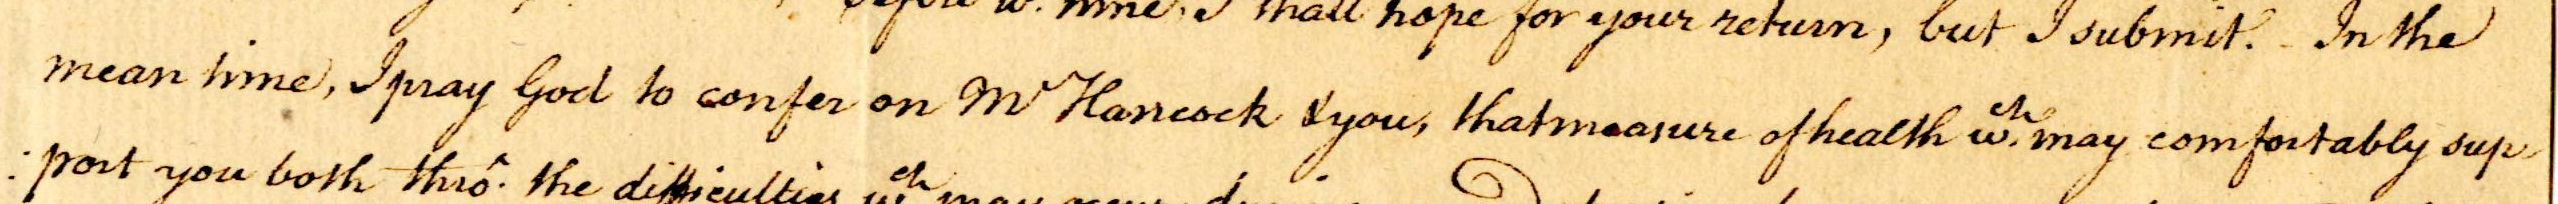mean time, I pray God to confer on M^r Hancock & you, that measure of health w^ch. may comfortably sup
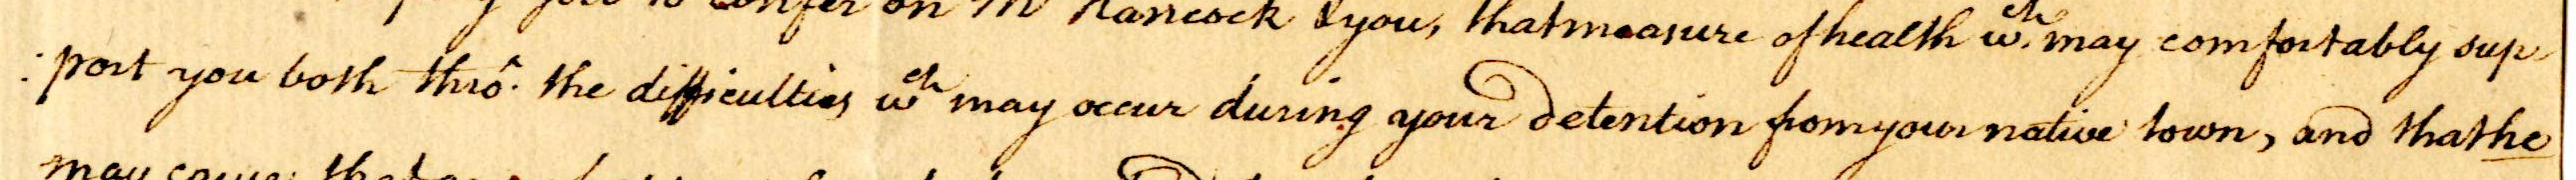-port you both thro' the difficulties w^ch may occur during your detention from your native town, and that he
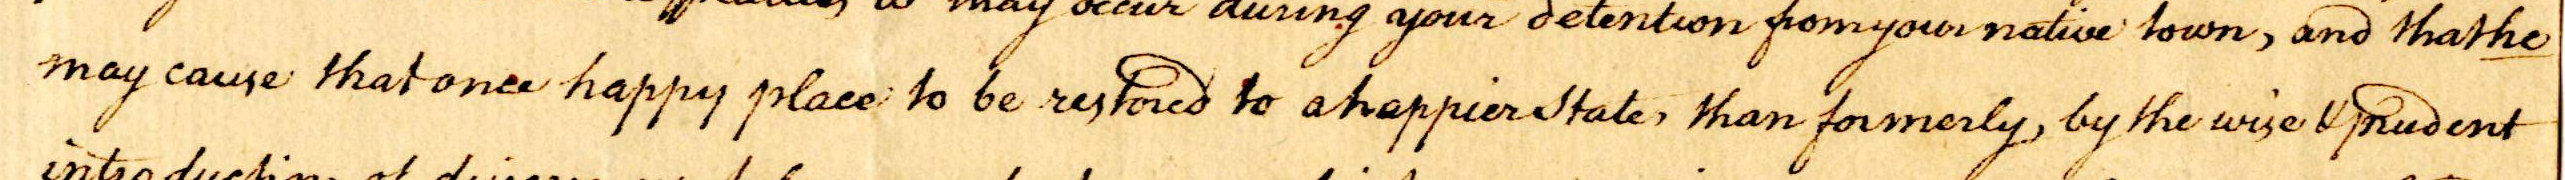may cause that once happy place to be restored to a happier State than formerly, by the wise & prudent
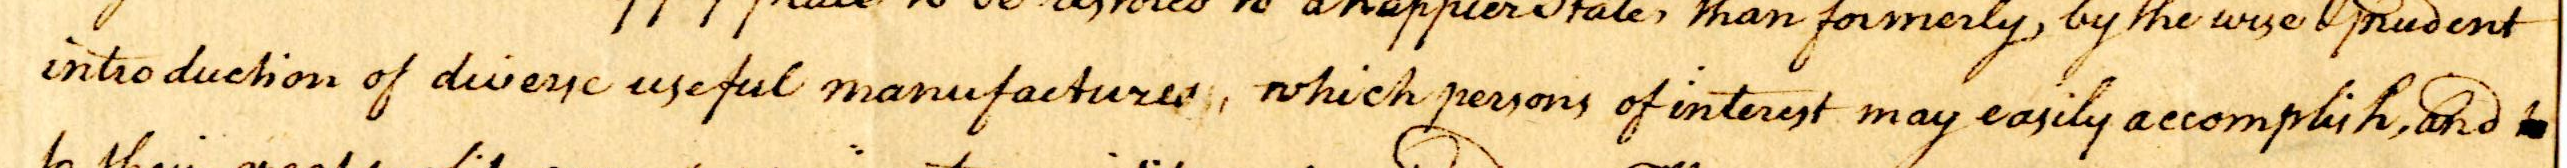introduction of diverse useful manufactures, which persons of interest may easily accomplish, and to
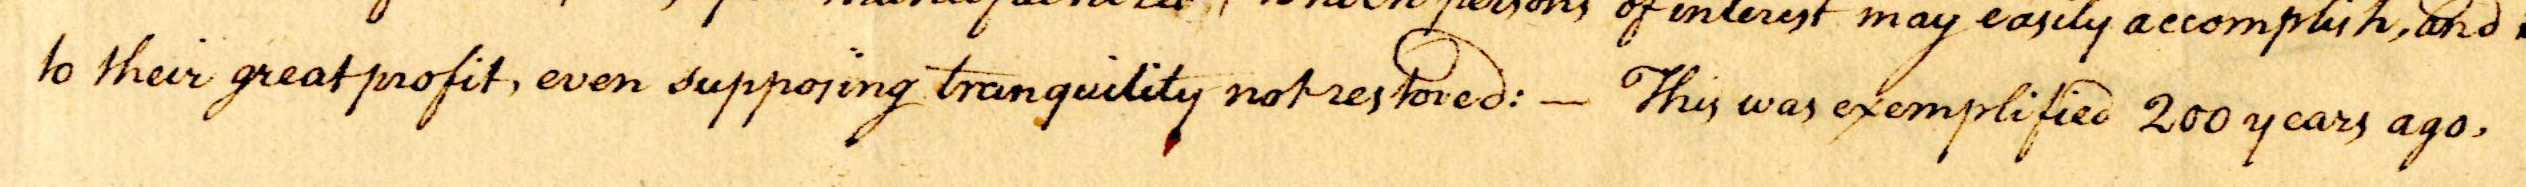to their great profit, even supposing tranquility not restored:- This was exemplified 200 years ago.
